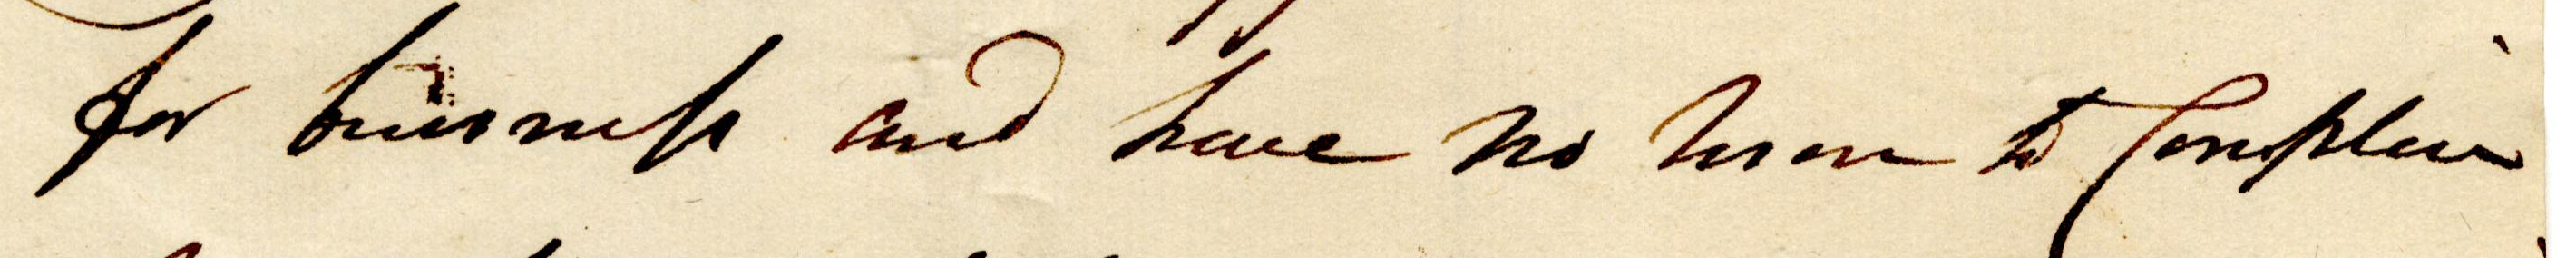for business and have no reson to Complain
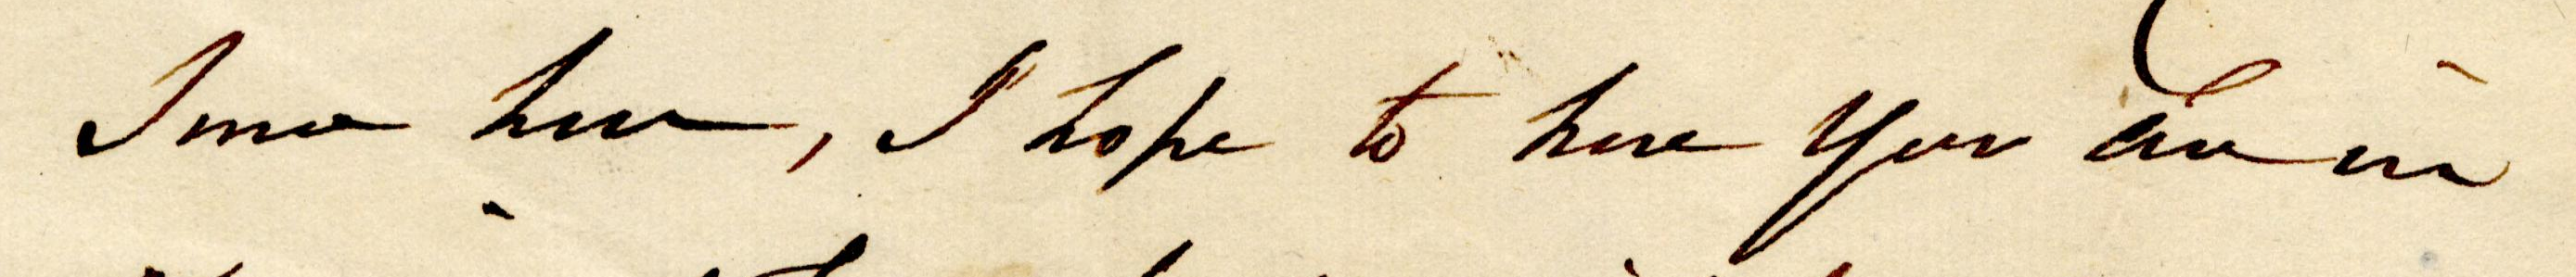Ime here, I hope to here You are in
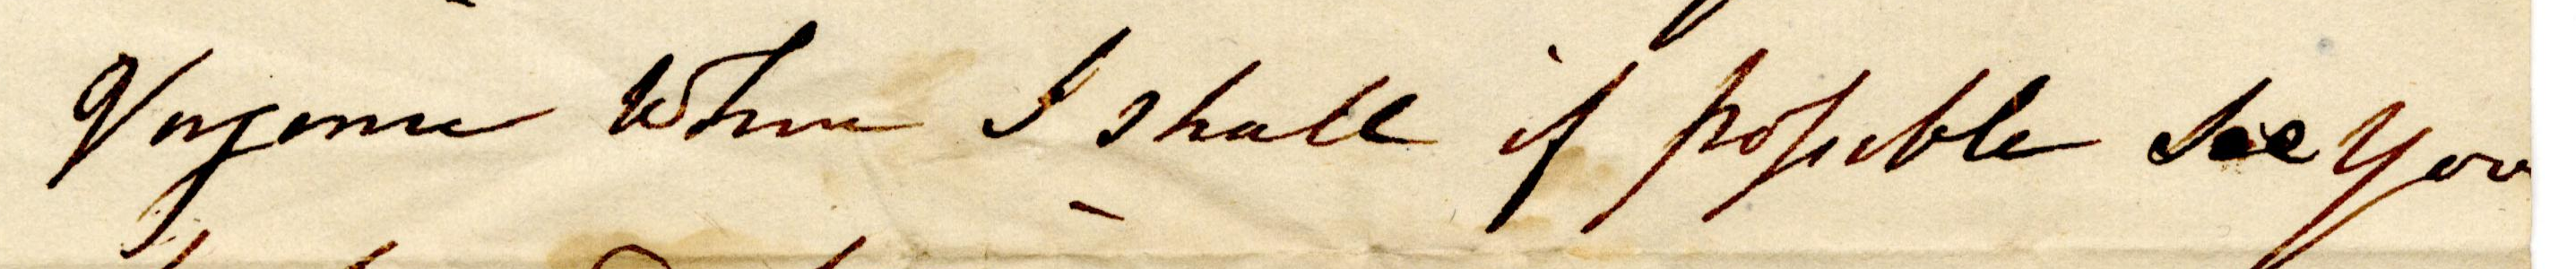Virginia When I shall if possible see you
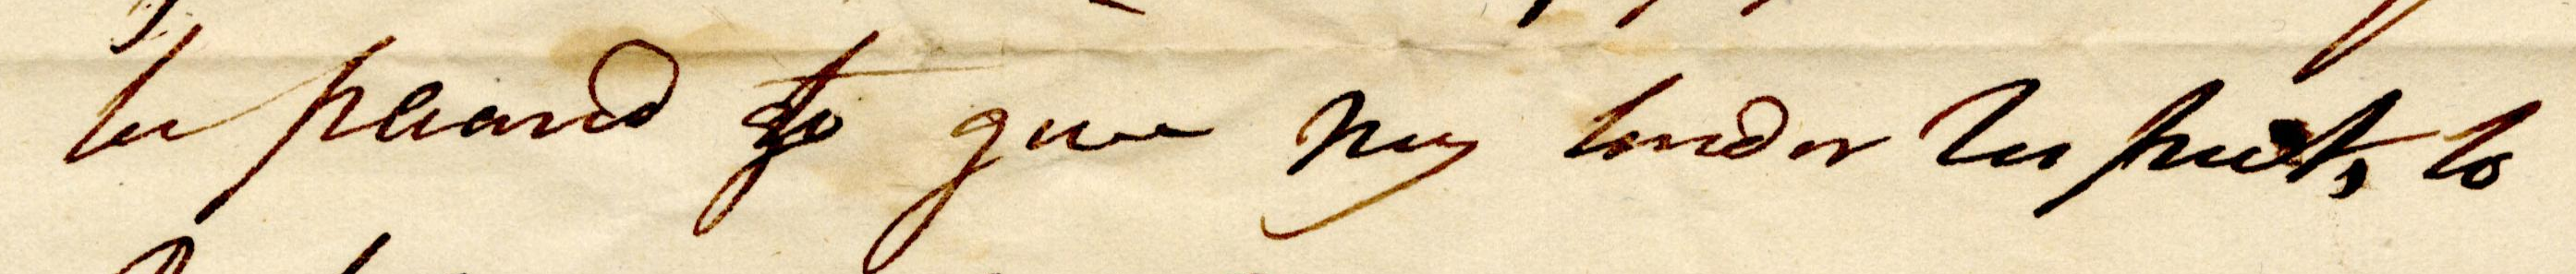be pleased to give my tender respects to
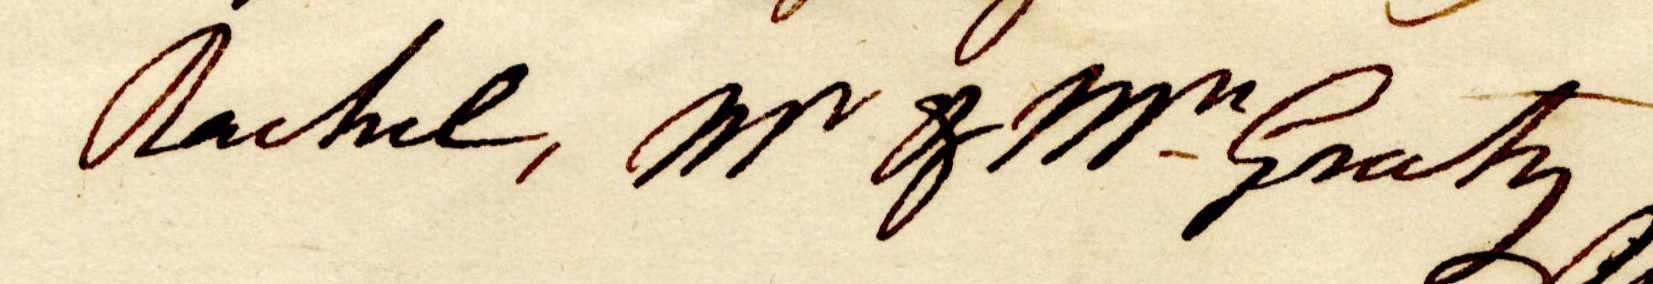Rachel, M^r & M^r. Gratz
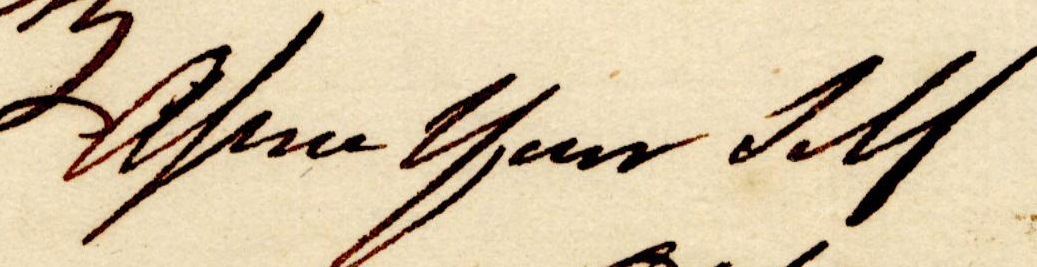Also your self
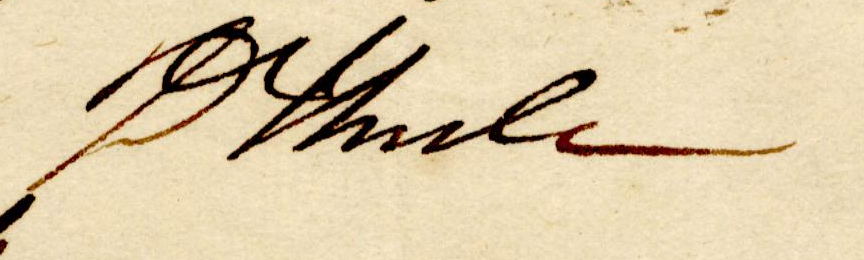D^r Hull
